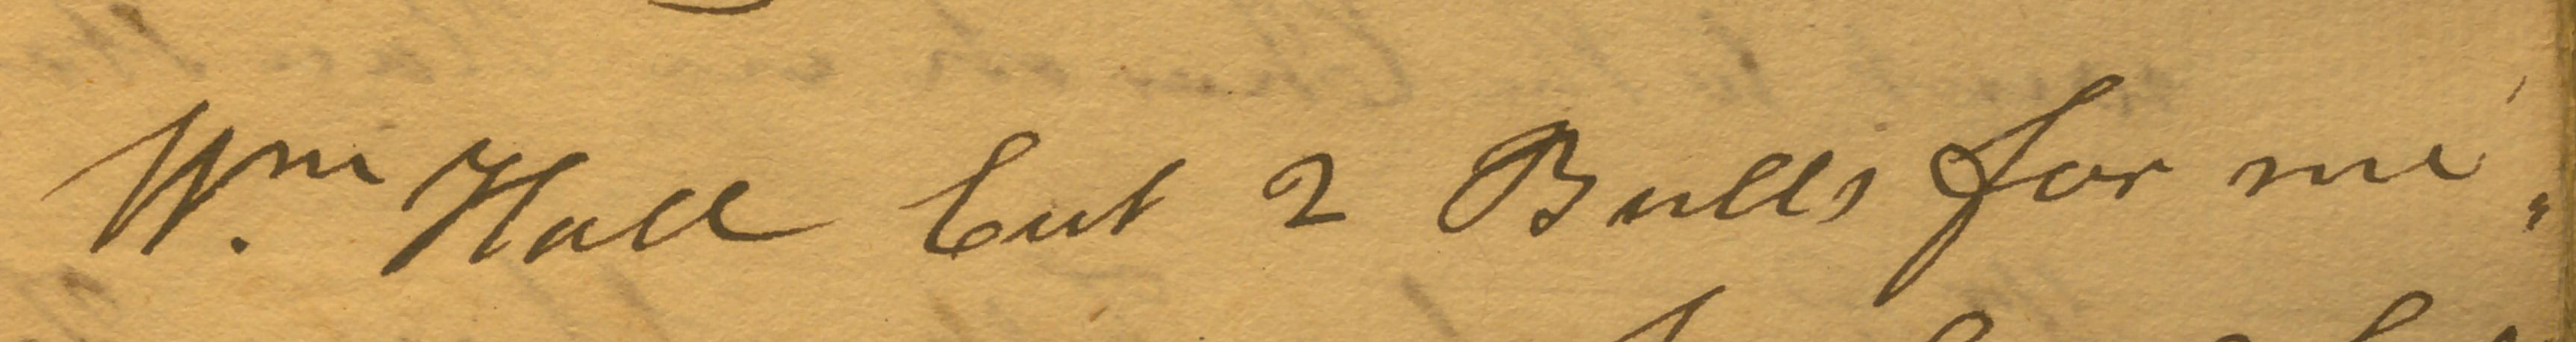W^m. Hall Cut 2 Bulls for me
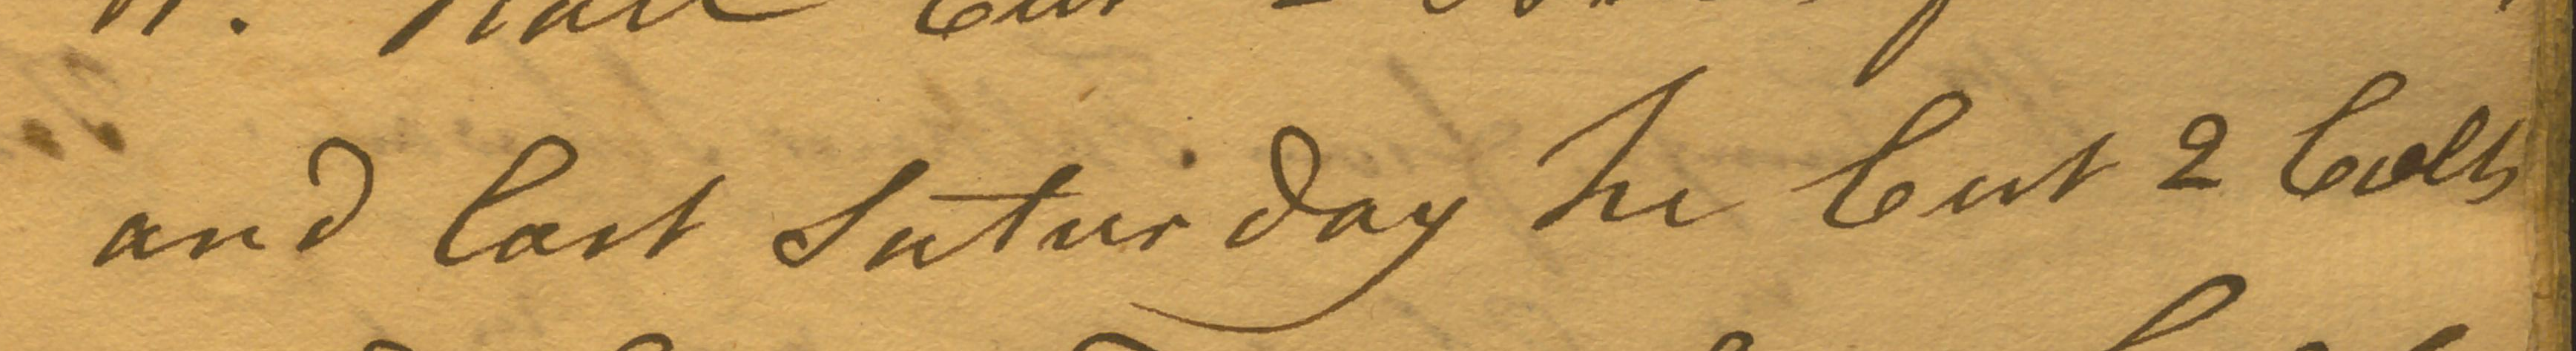and last Saturday he Cut 2 Colts
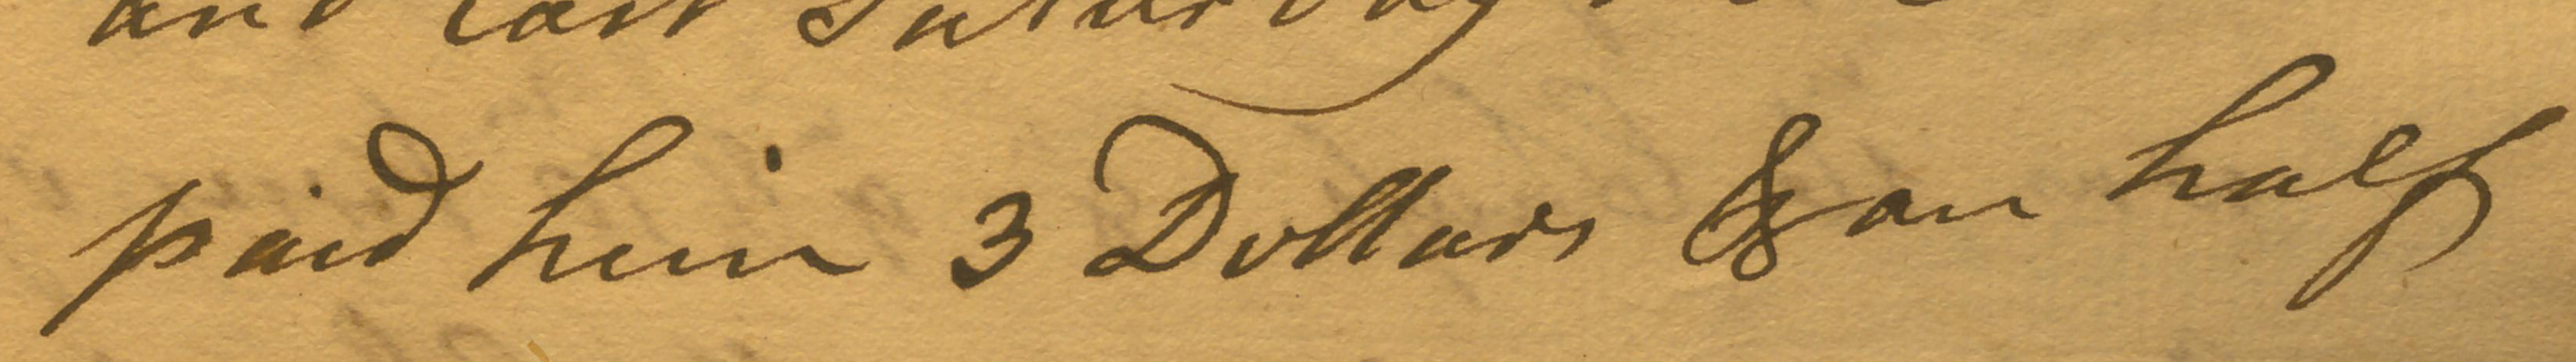paid him 3 Dollars & an half
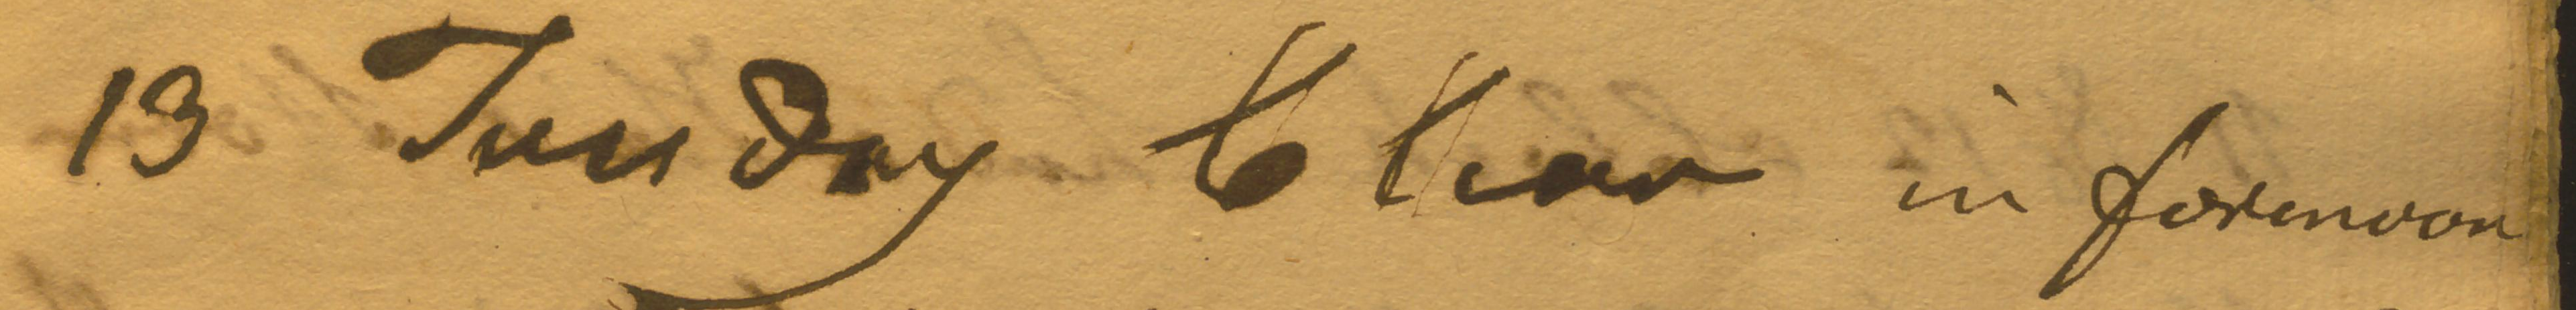13 Tuesday Clear in forenoon
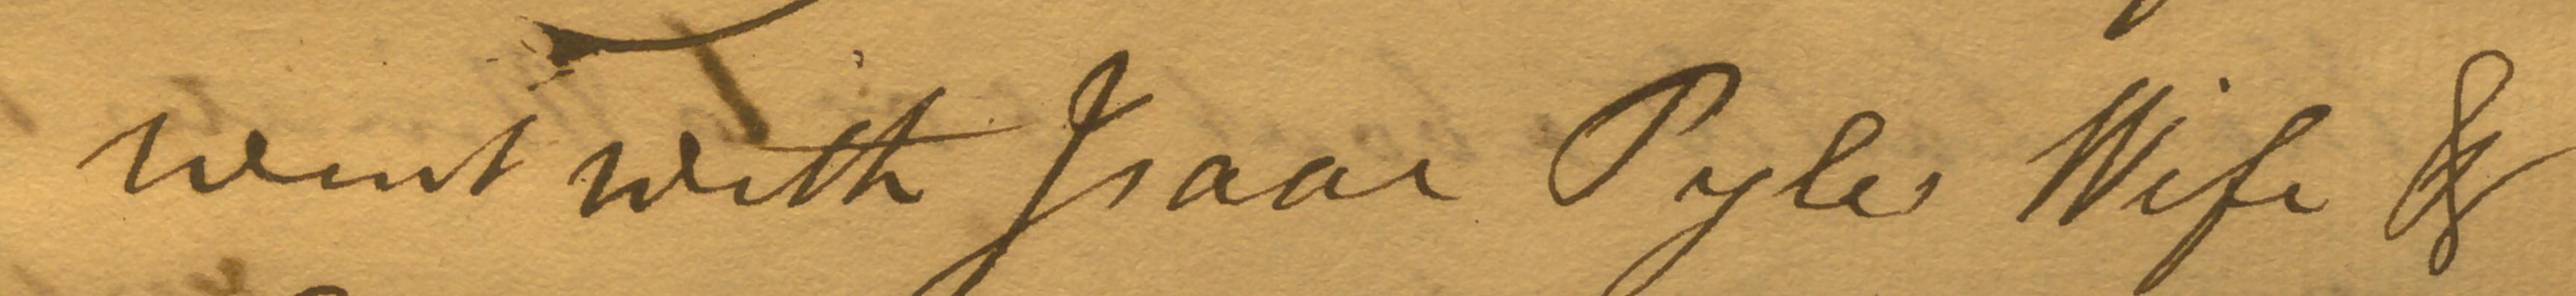went with Isaac Pyles Wife &
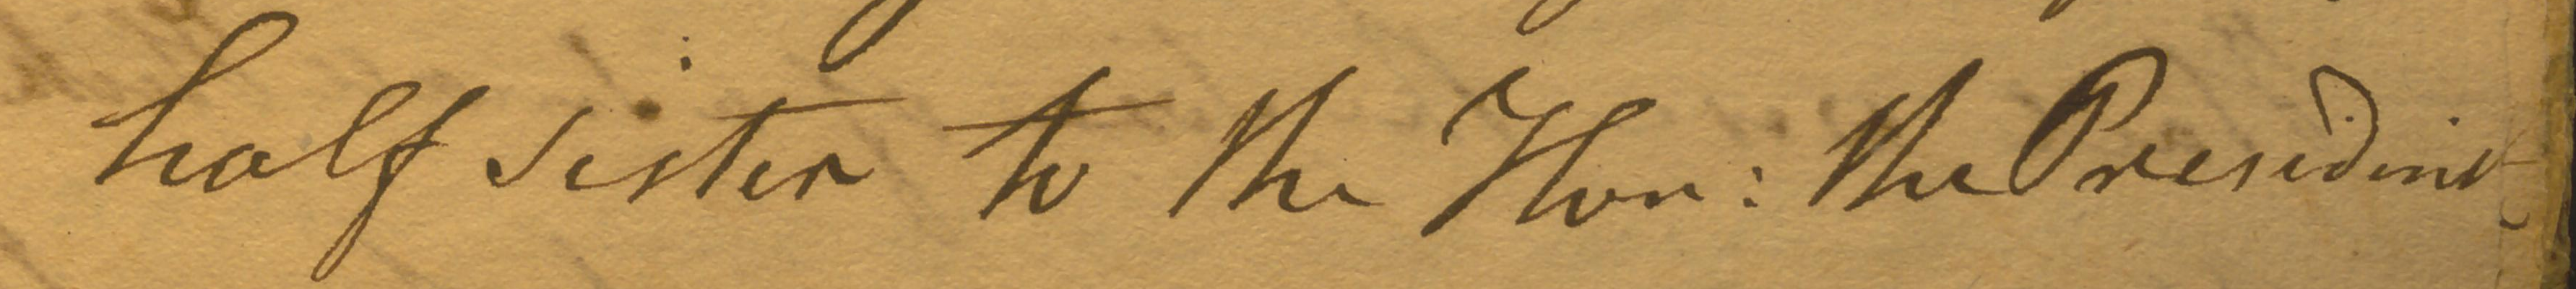half sister to the Hon: the President
